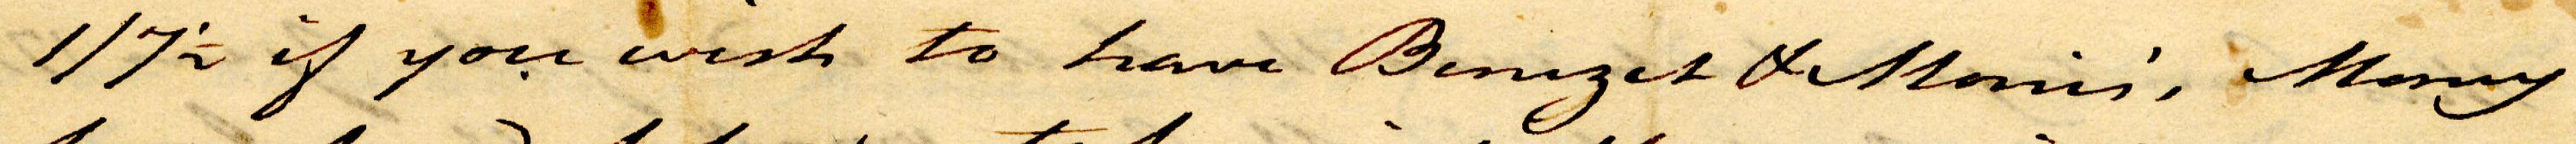1s7 1/2 if you wish to have Benezet & Morris: Money
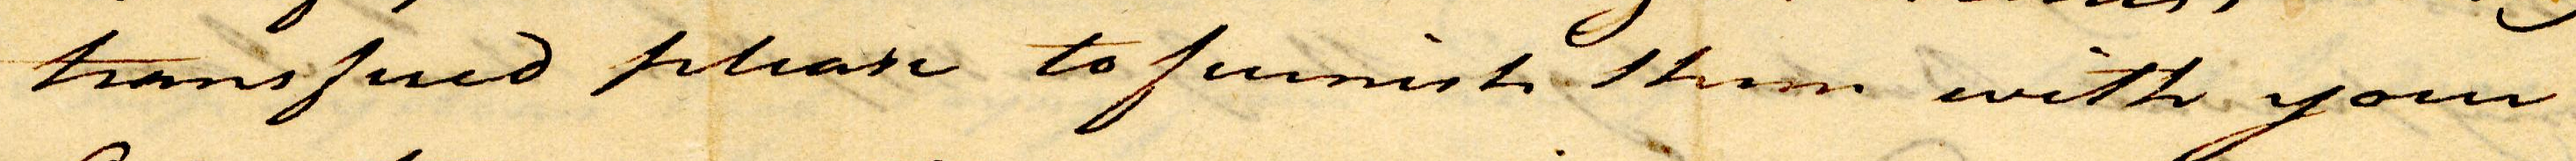transfered please to furnish them with your
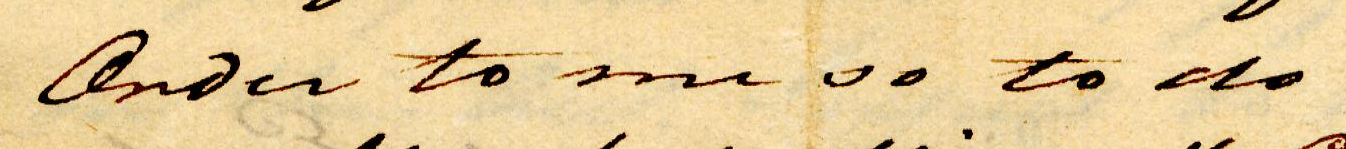Order to me so to do
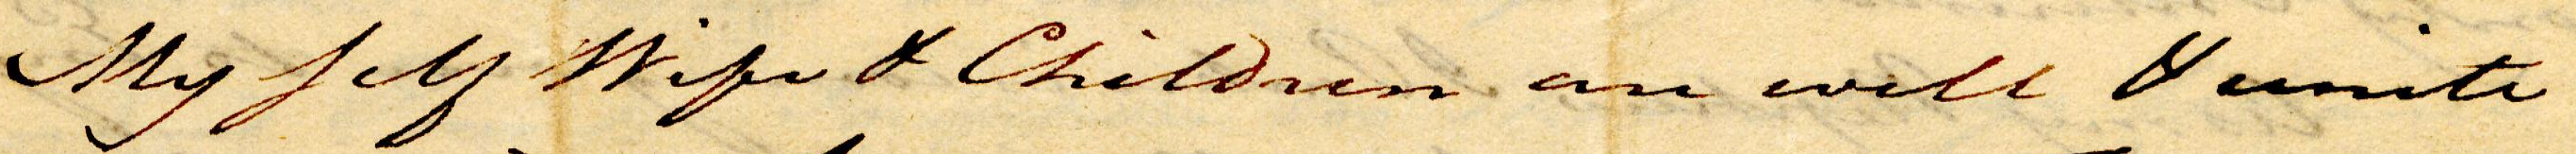My Self Wife & Children are well & unite
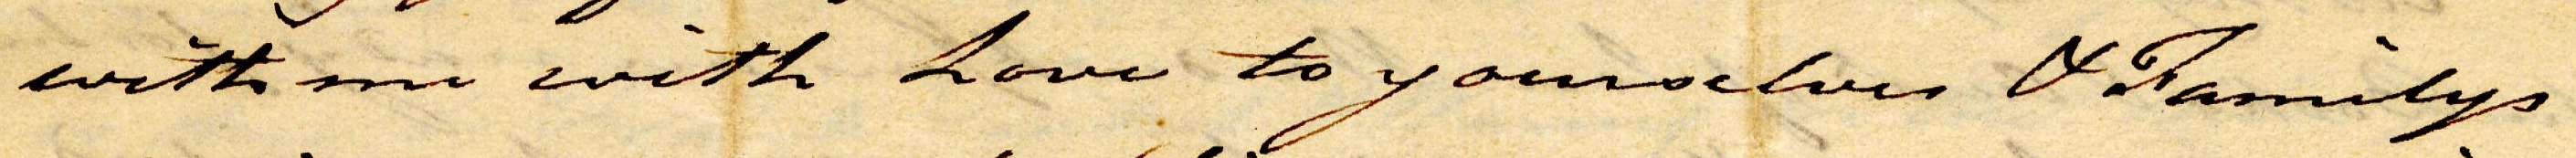with me with Love to yourselves & Familys
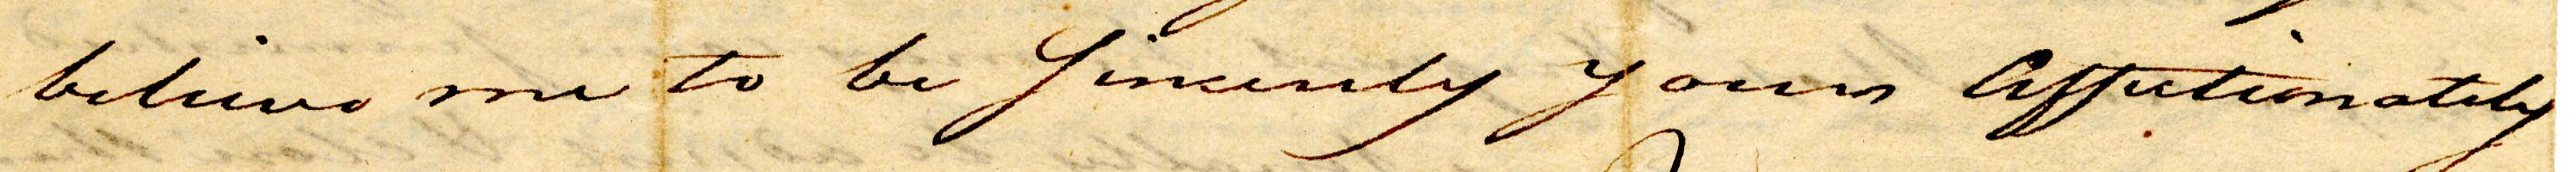believe me to be sincerely yours affectionately
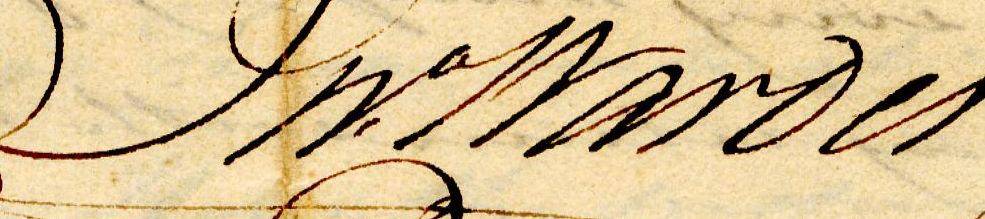Jn^o Warder
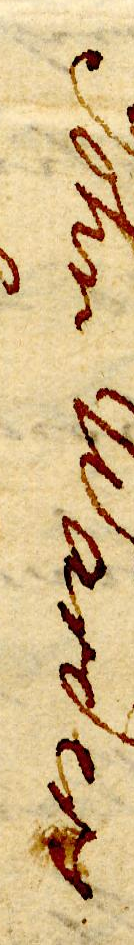John Warders
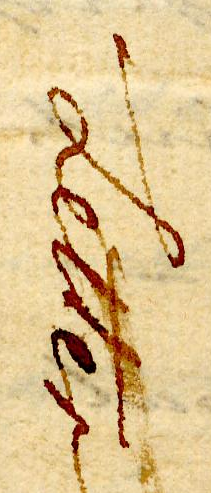Letter
